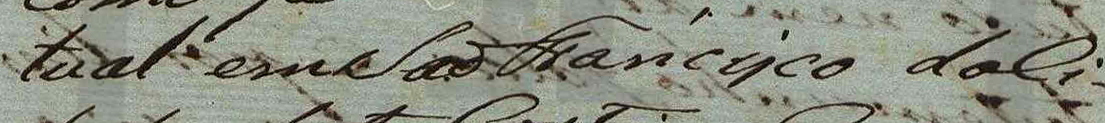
tual em Saõ Francisco da Ci
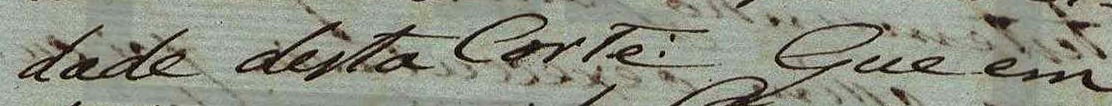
dade desta Corte: Que em
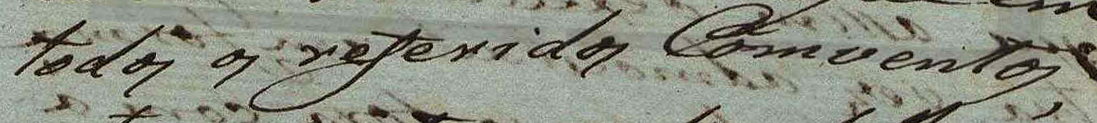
todos os referidos Comventos
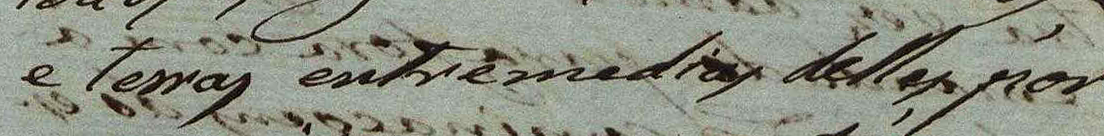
e terras entremedias delles, por
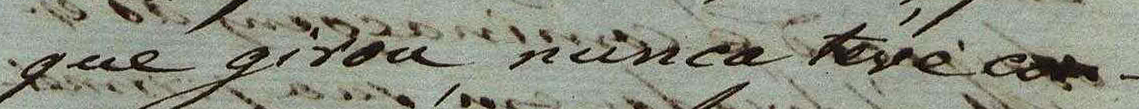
que girou, nunca teve con
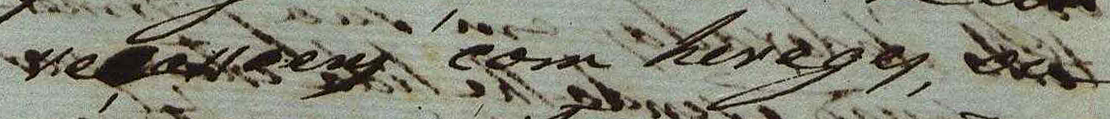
veçassoens com hereges, ou
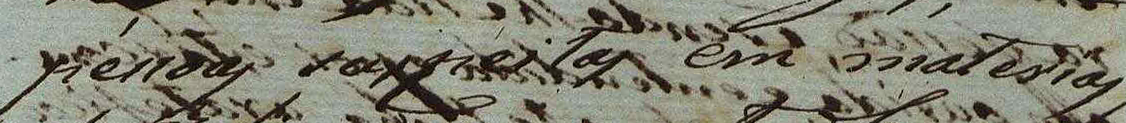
pessoas sospeitas em materias
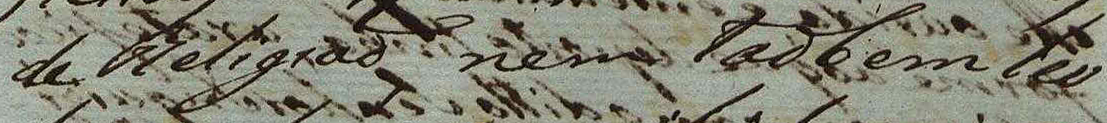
de Religiaõ nem taõbem leu
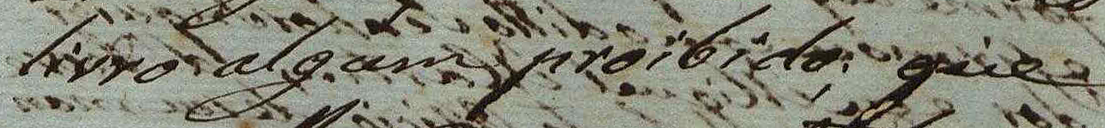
livro algum proibido; que
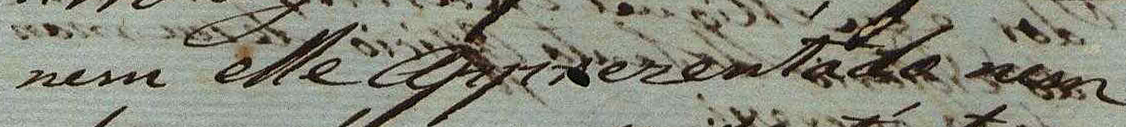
nem elle Apprezentado nem
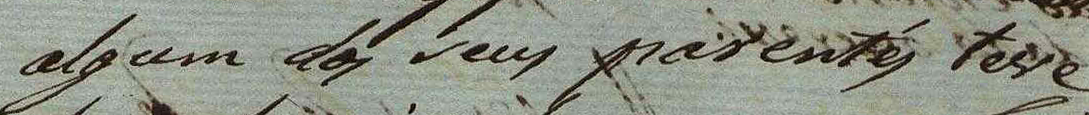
algum dos seus parentes teve
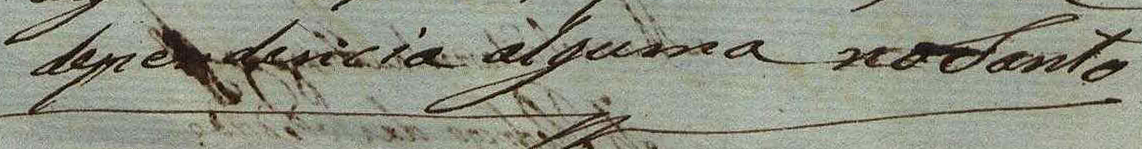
dependencia alguma no Santo
